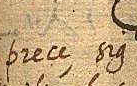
prece, sig
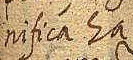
nifica ha
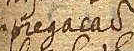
pregaçaõ
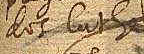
dos luthe
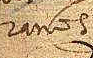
ranos
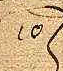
10
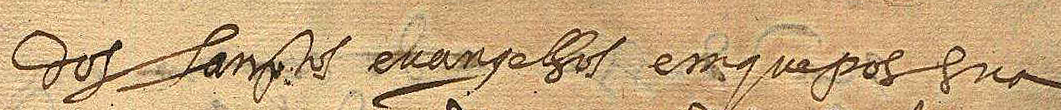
dos sanctos euangelhos em que pos sua
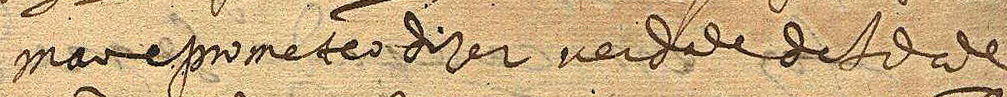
mao e prometeo dizer uerdade de Idade
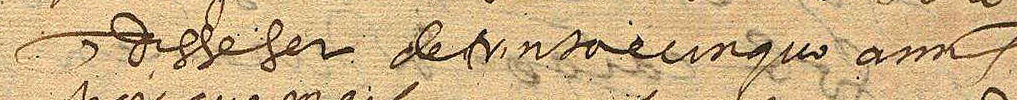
q̄ disse ser de trinta e cinquo annos
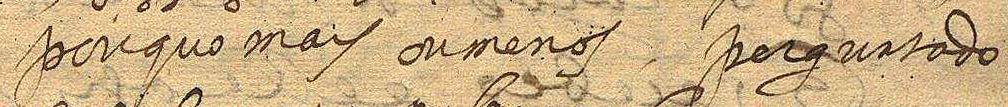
pouquo mais ou menos, perguntado
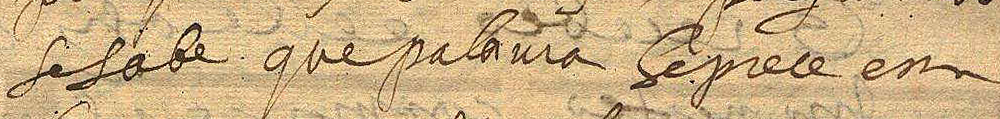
se sabe que palaura he prece em
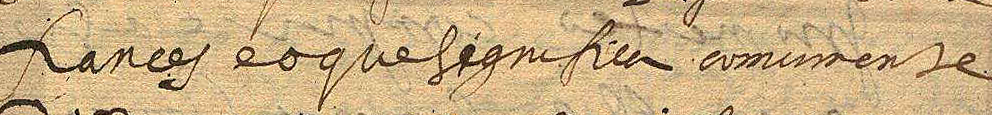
frances, e o que significa comumente
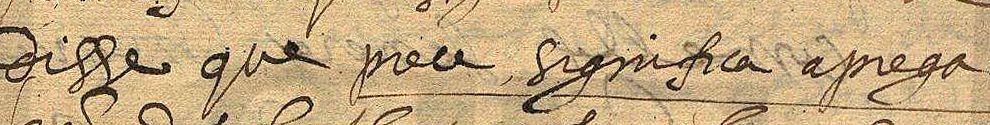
disse que prece significa a prega
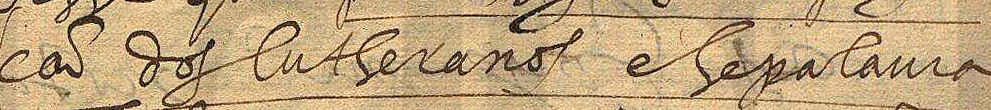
ção dos lutheranos e he palaura
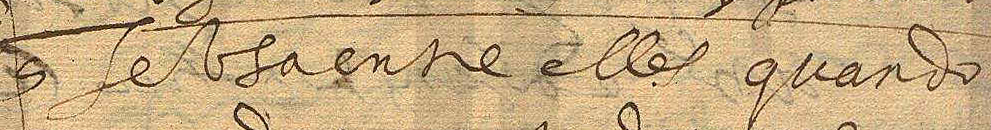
q̄ se vsa entre elles quando
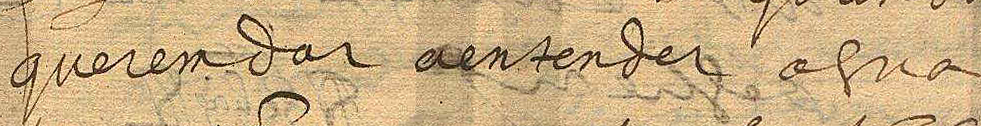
querem dar a entender a sua
